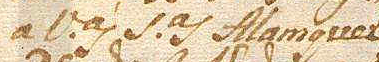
a V.as s.as Alamquer
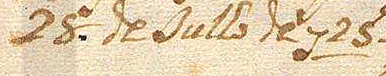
28. de Iulho de 725.
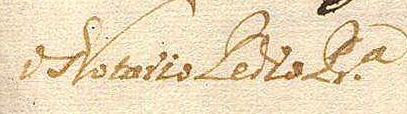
o Notario Pedro Pr.a
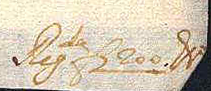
Regda fl 200 Ꝟso
